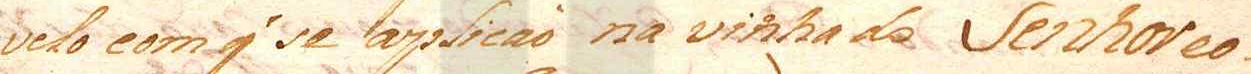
veLo com q̄ se aplicaõ na vinha do Senhoreo
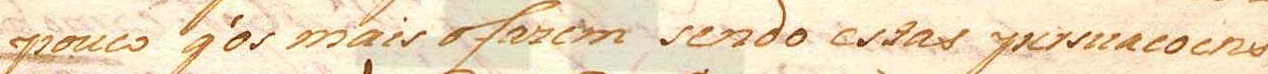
pouco q̄ os mais o fazem sendo estas persuacoens
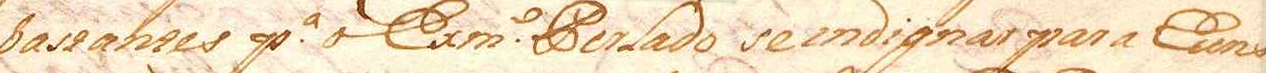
bastantes p.a o Exm.o PerLado se indignar para huns
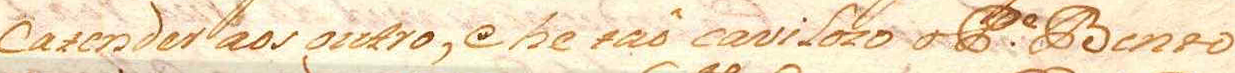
e atender aos outro, e he taõ caviLozo o P.e Bento
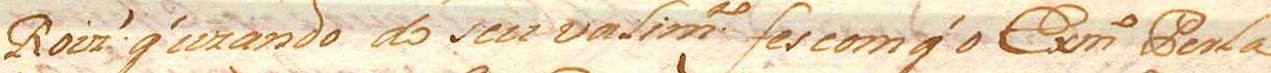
Roiz̄ q̄ uzando do seu vaLim.to fes com q̄ o Exm.o PerLa
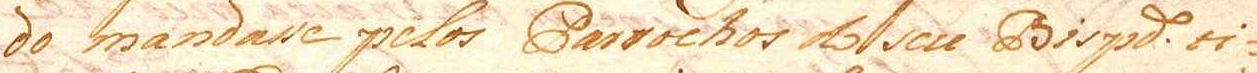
do mandasse pelos Parrochos do seu Bispad.o ti
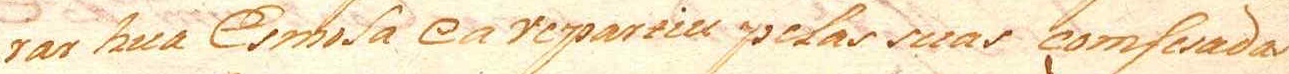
rar hua EsmoLa e a repartiu peLas suas comfesadas
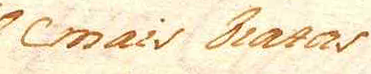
e mais beatas
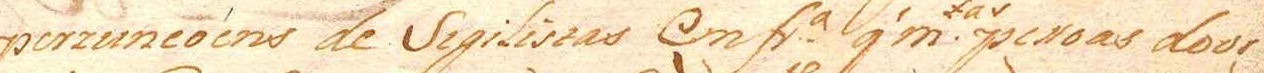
perzuncoens de Sigilistas em fr.a q̄ m.tas pessoas dovi
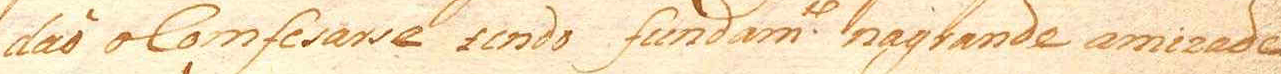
daõ o Comfesarse tendo fundam.to na grande amizade
